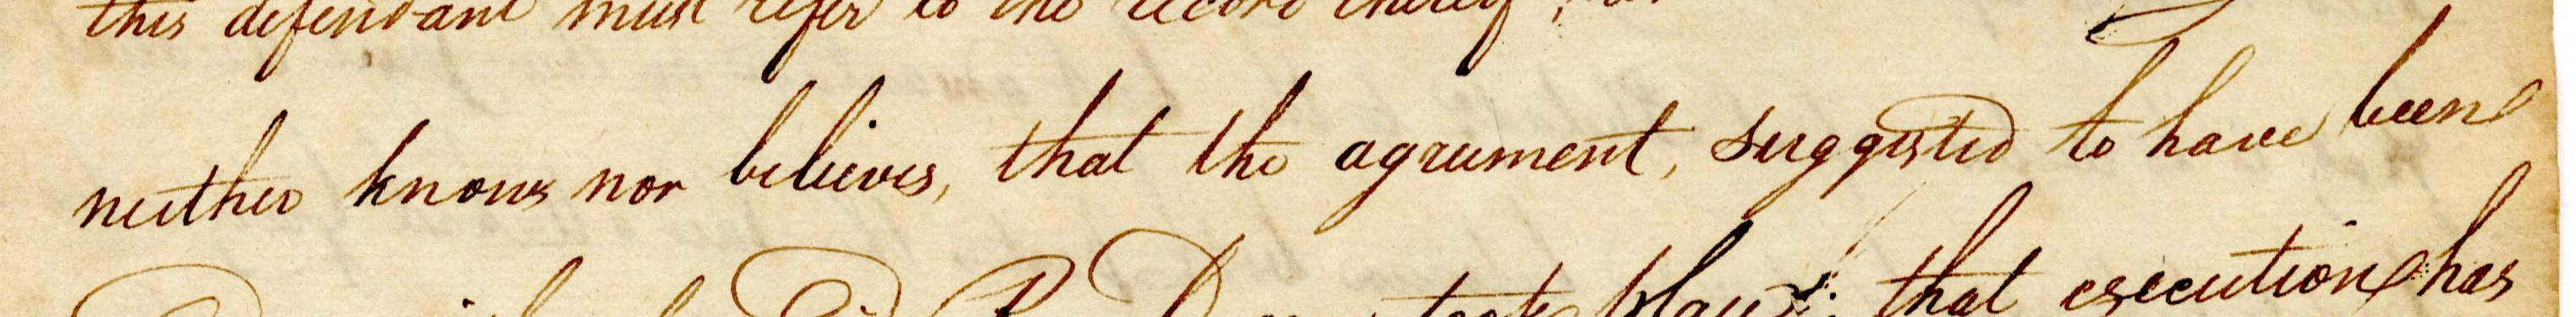neither knows nor believes, that the agreement suggested to have been
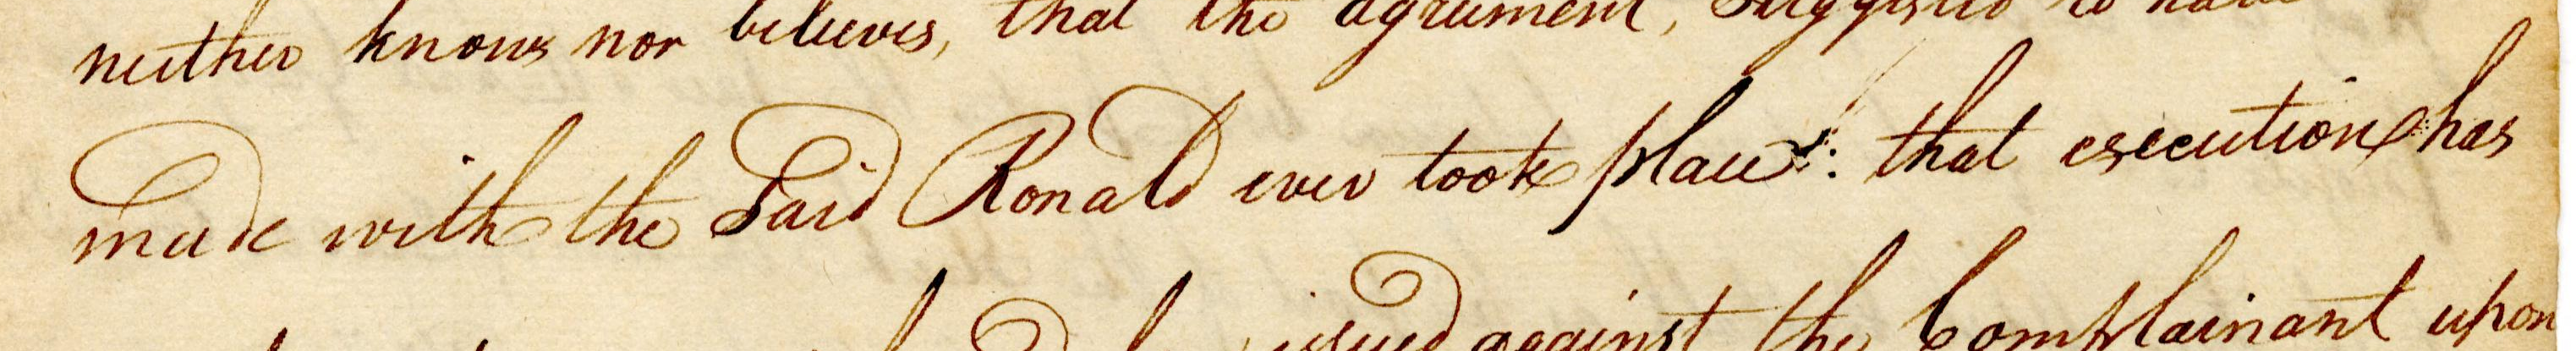made with the said Ronald even took place. that execution has
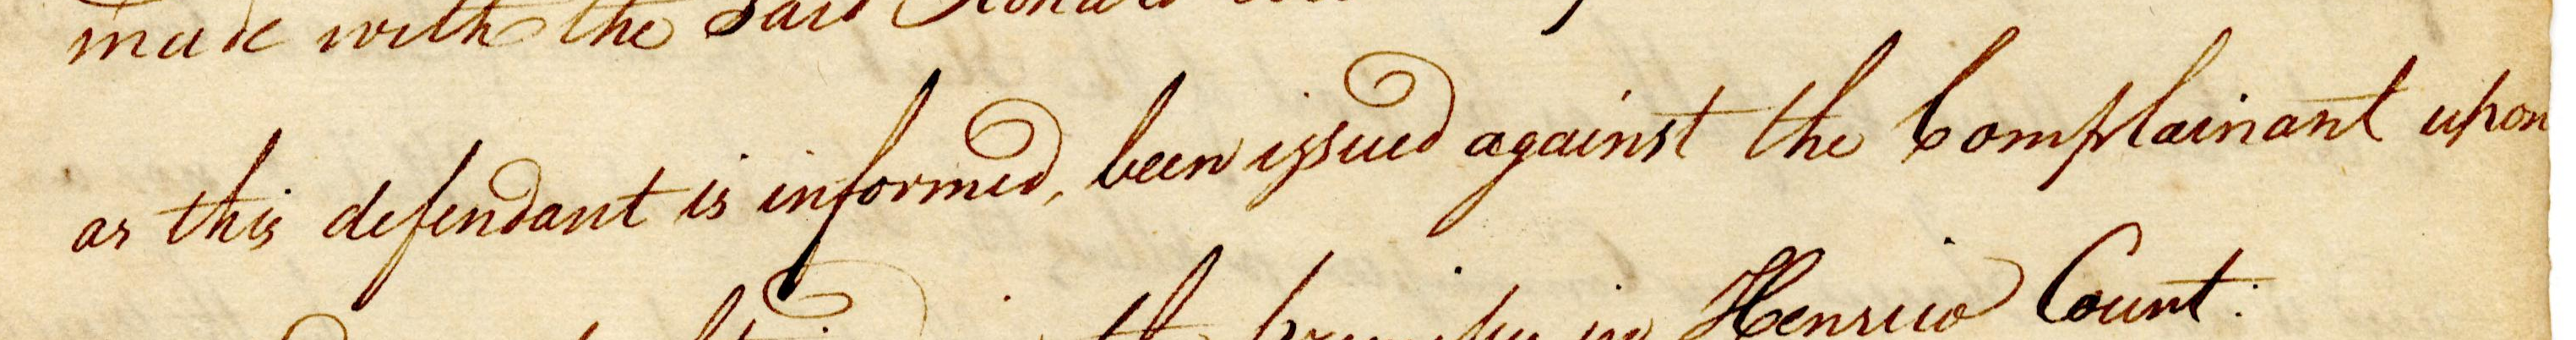as this defendant is informed been issued against the Complainant upon
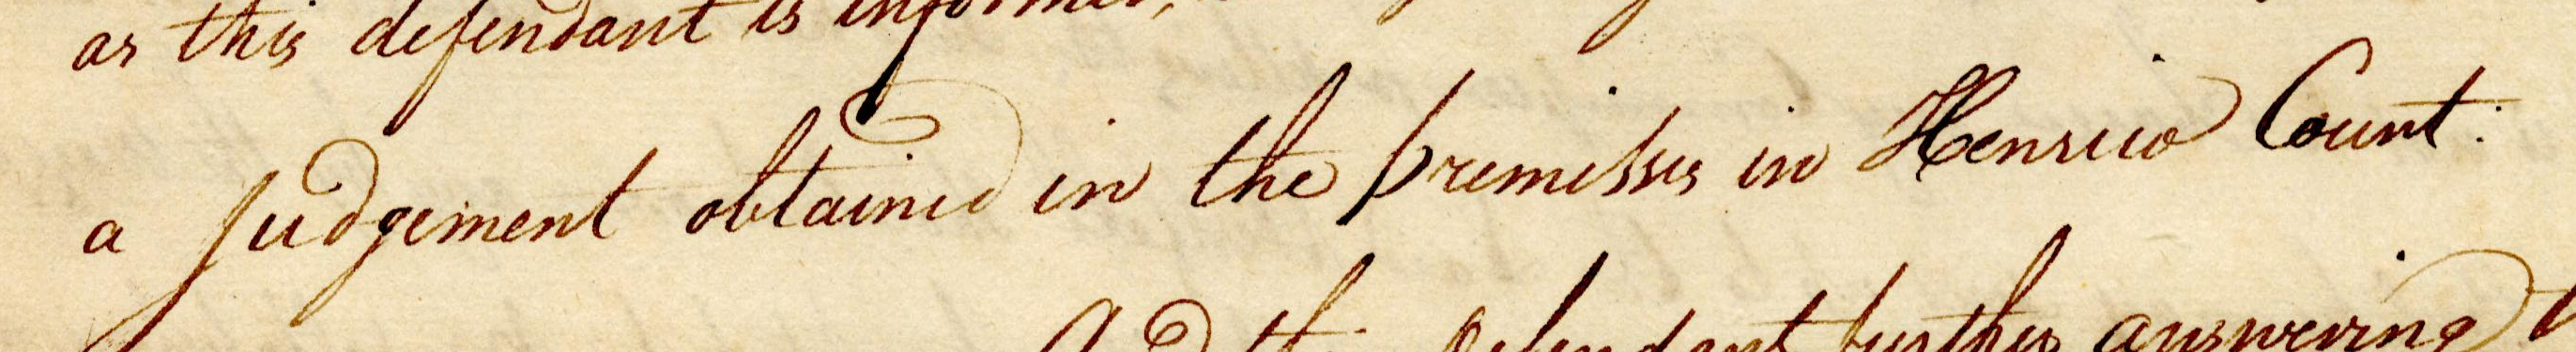a judgement obtained in the premises in Henrico Court:
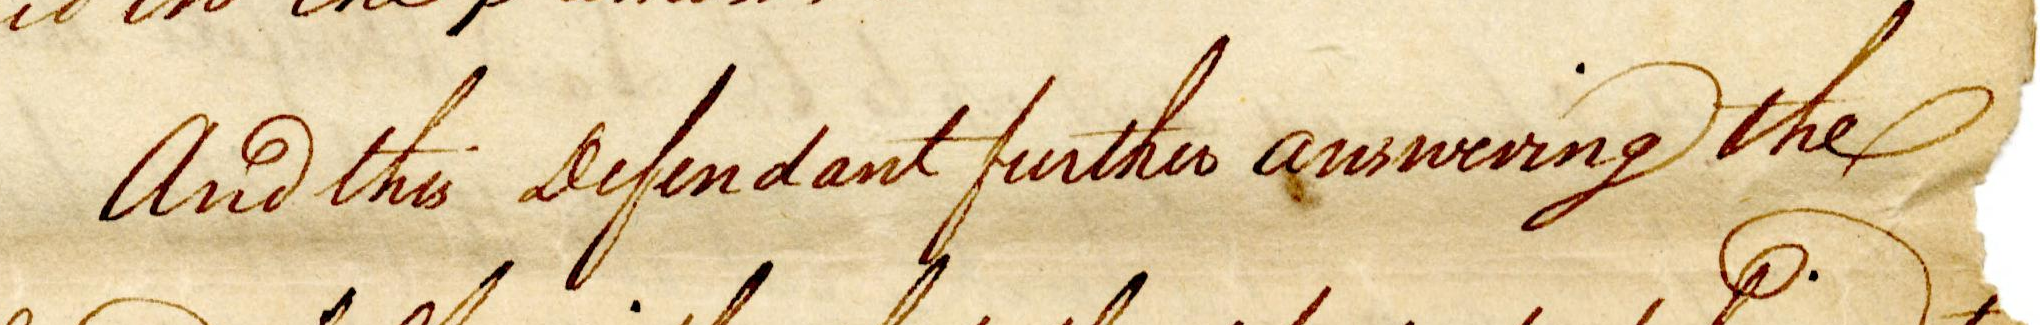And this defendent further answering the
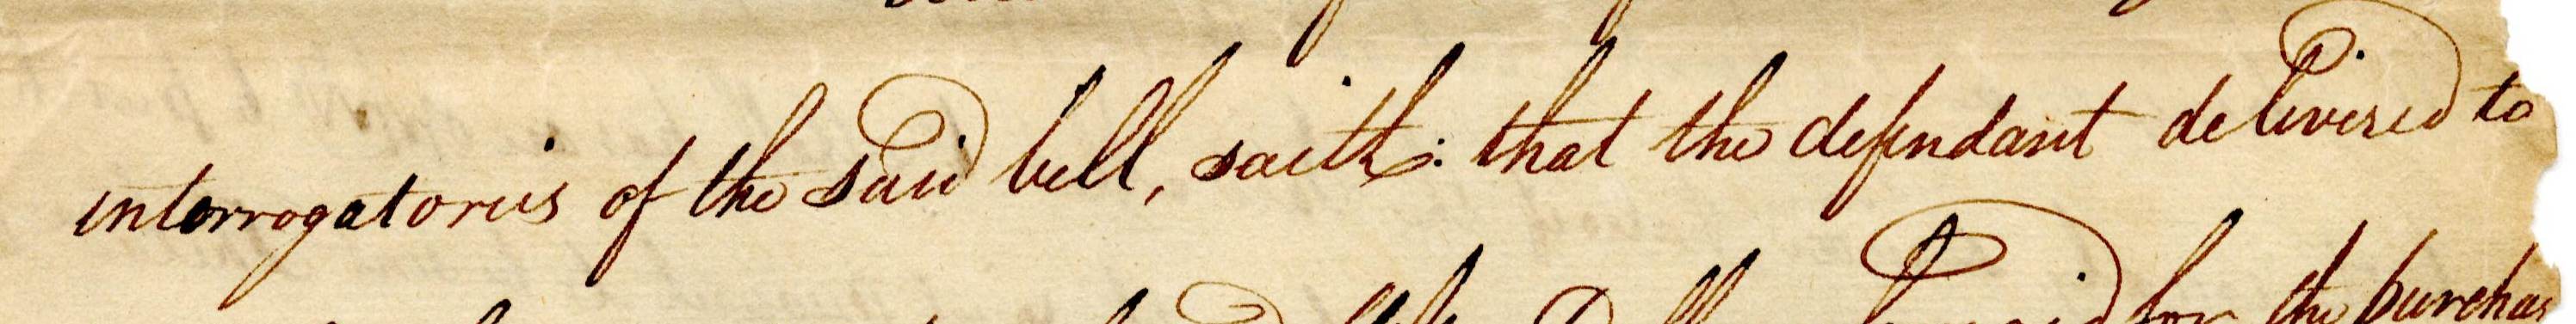interrogators of the said bill, saith: that the defendant delivered to
